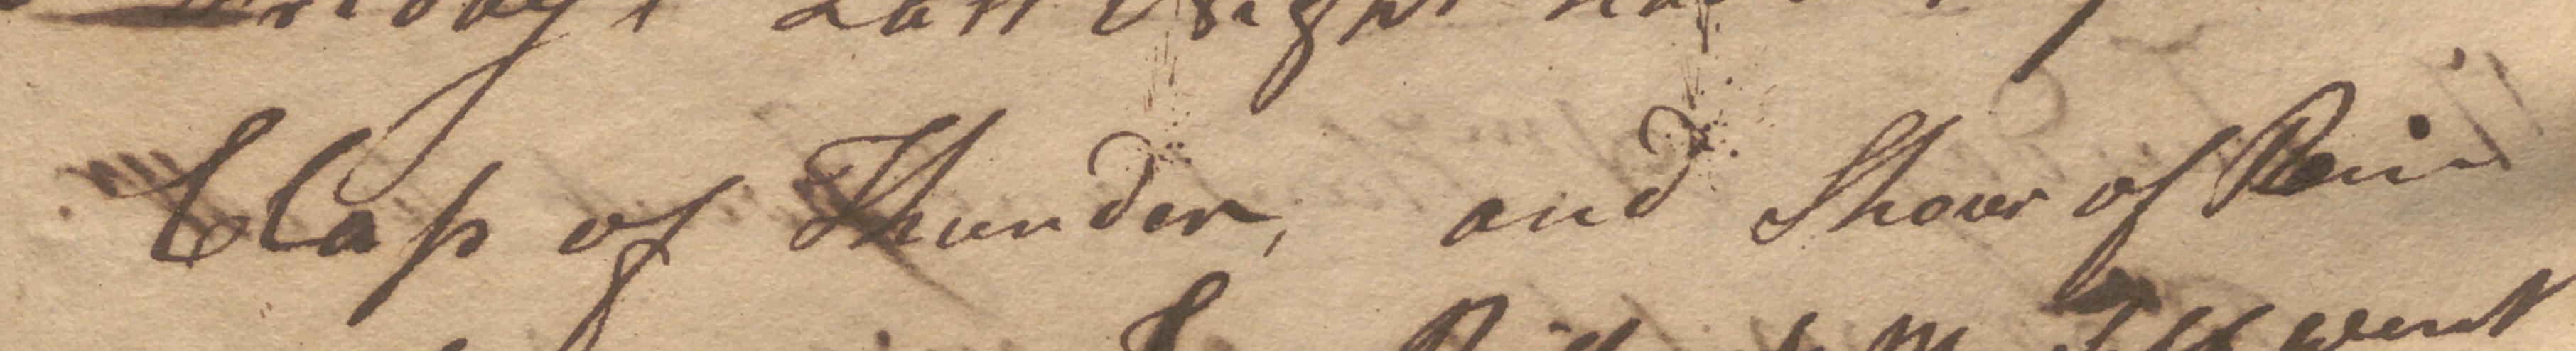Clap of Thunder, and Shour of Rain
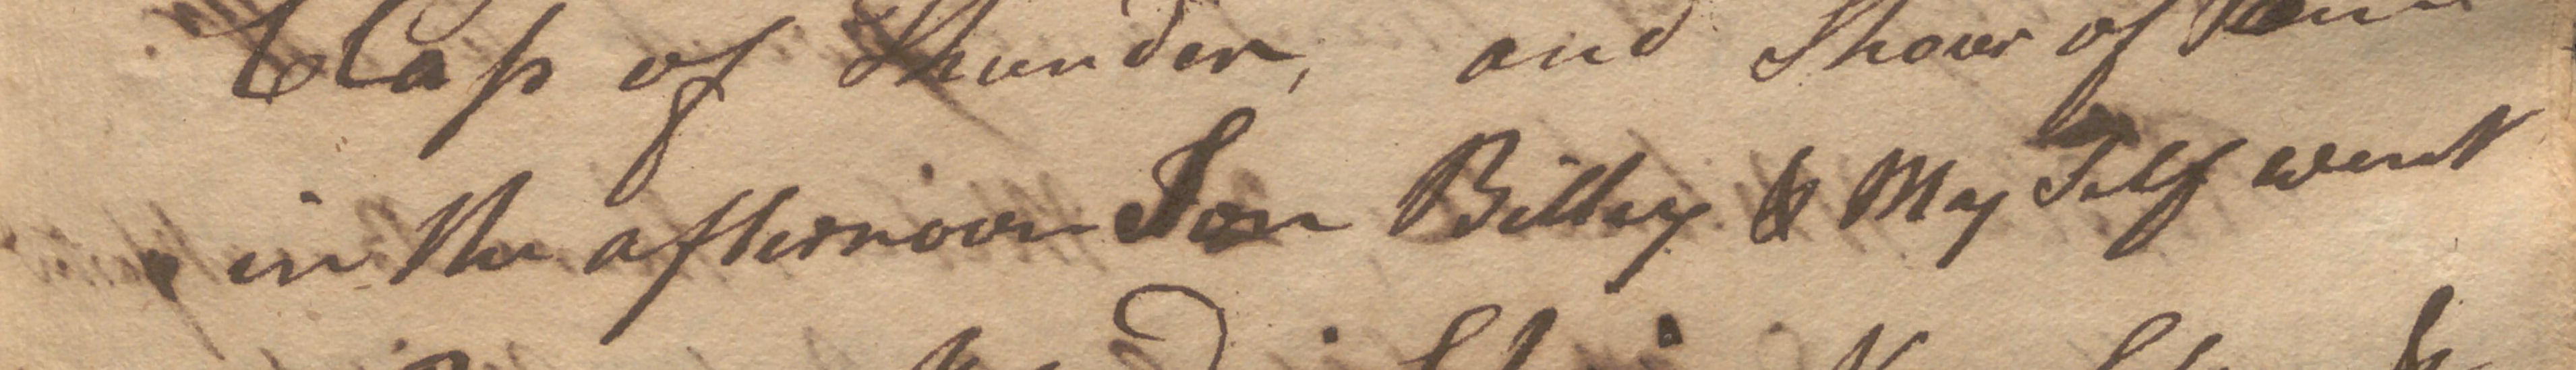in the afternoon Son Billey & My self went
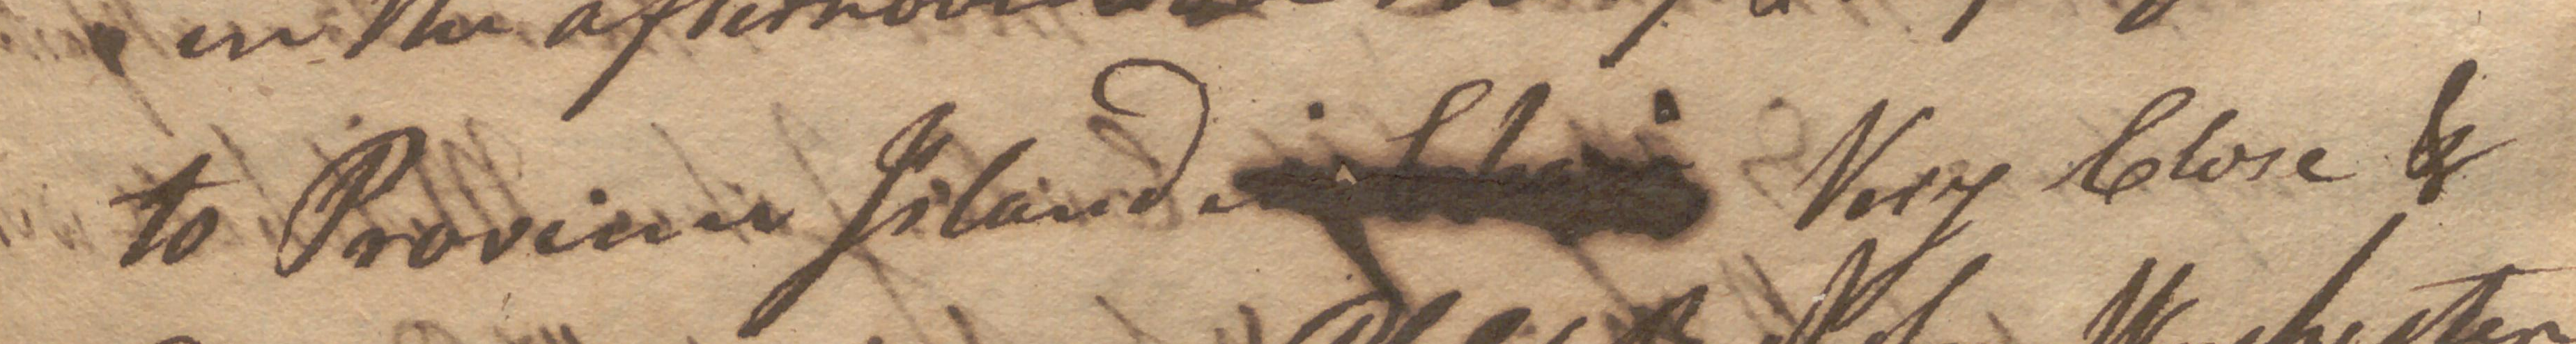to Province Island [______] Very Close &
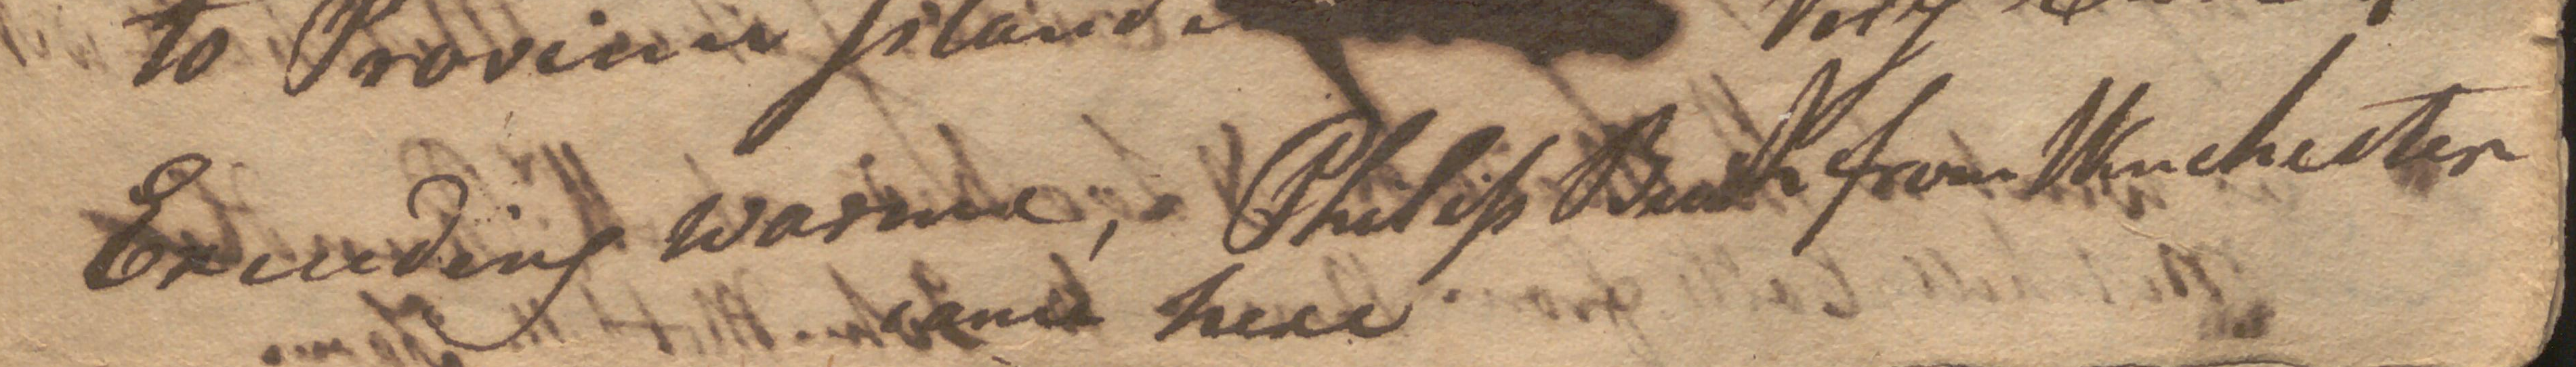Exceeding warme, Philip Bush from Winchester
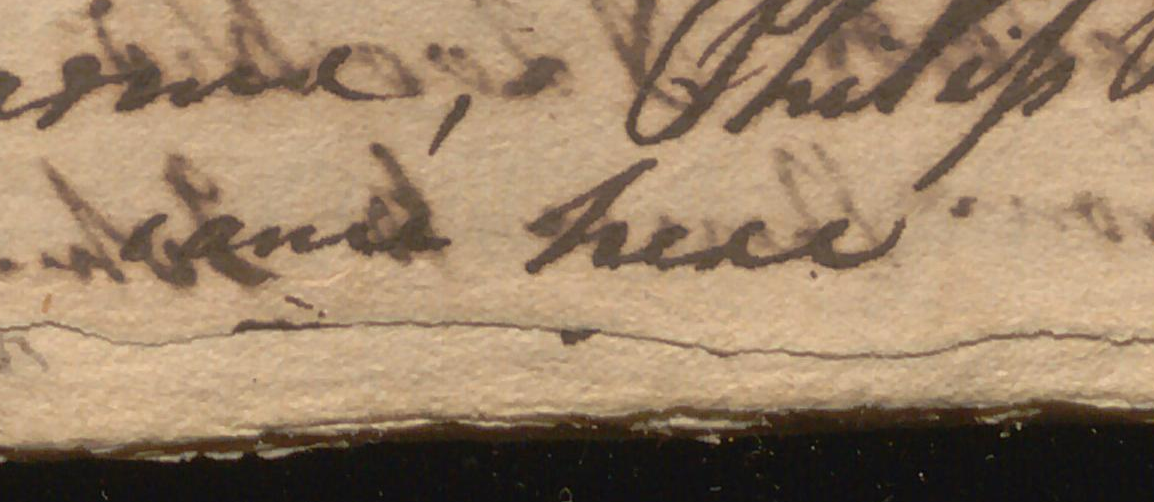came here
